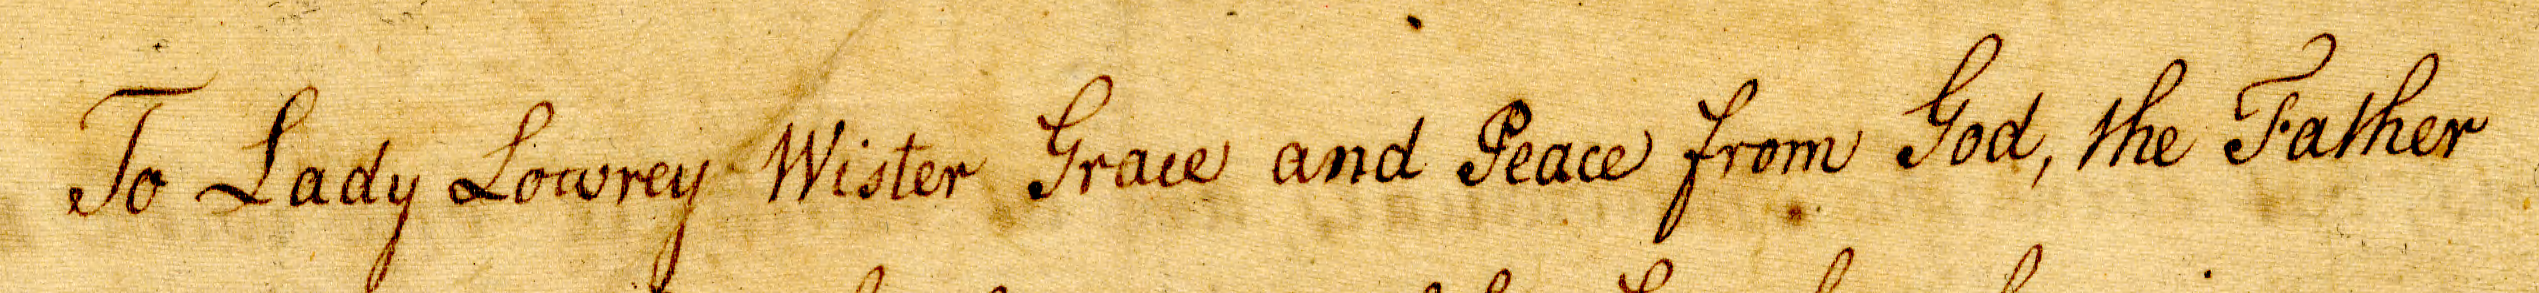To Lady Lowrey Wister Grace and Peace from God, the Father
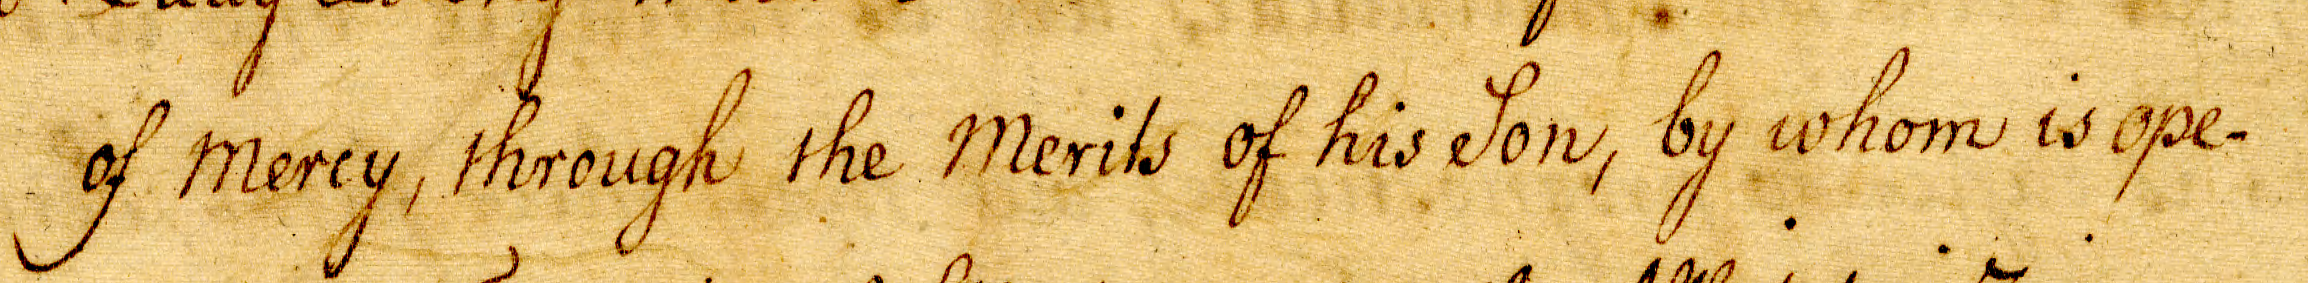of mercy, through the Merits of his Son, by whom is ope-
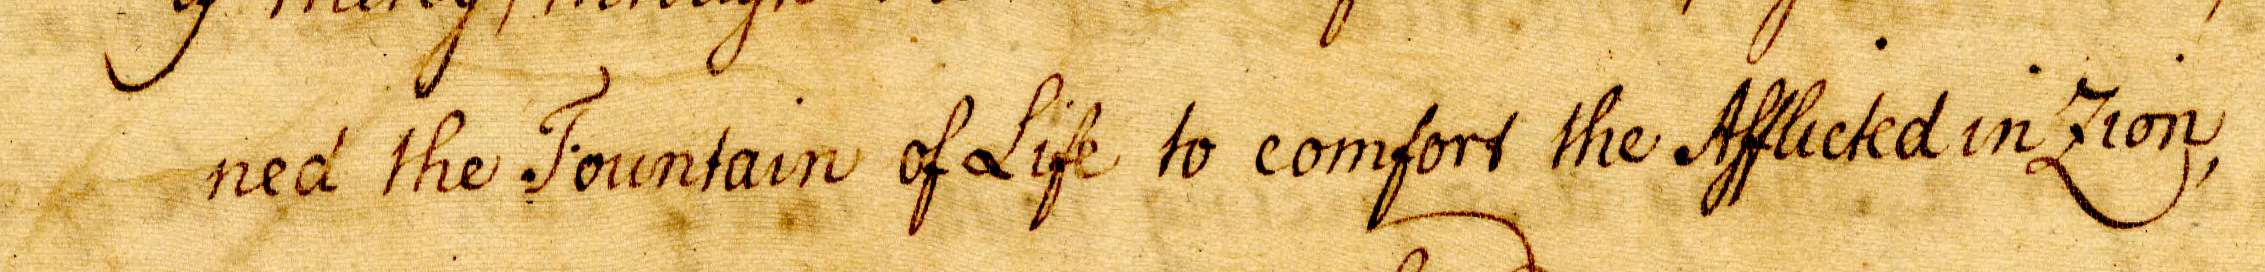ned the Fountain of Life to comfort the Afflicted in Zion,
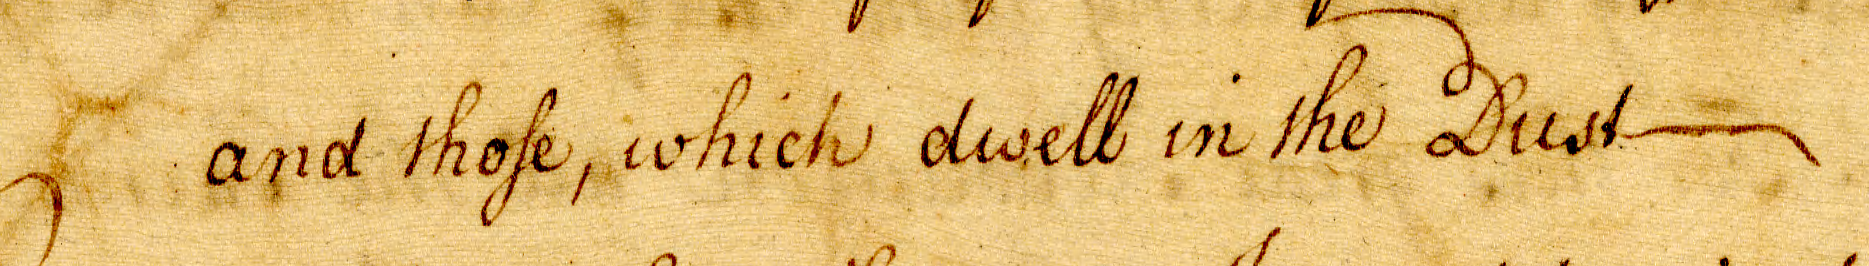and those, which dwell in the Dust-
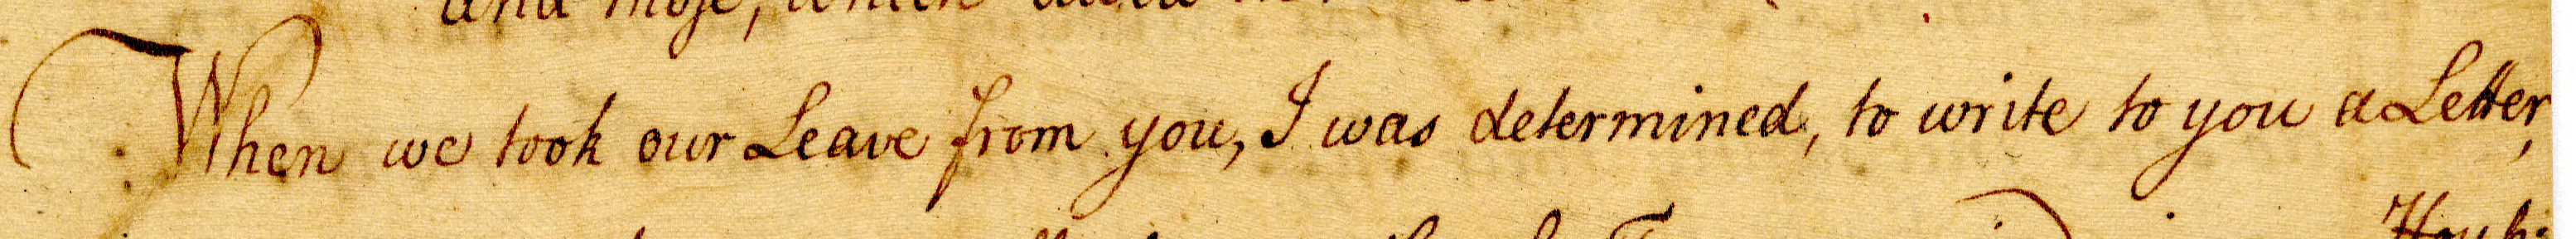When we took our Leave from you I was determined, to write to you a Letter,
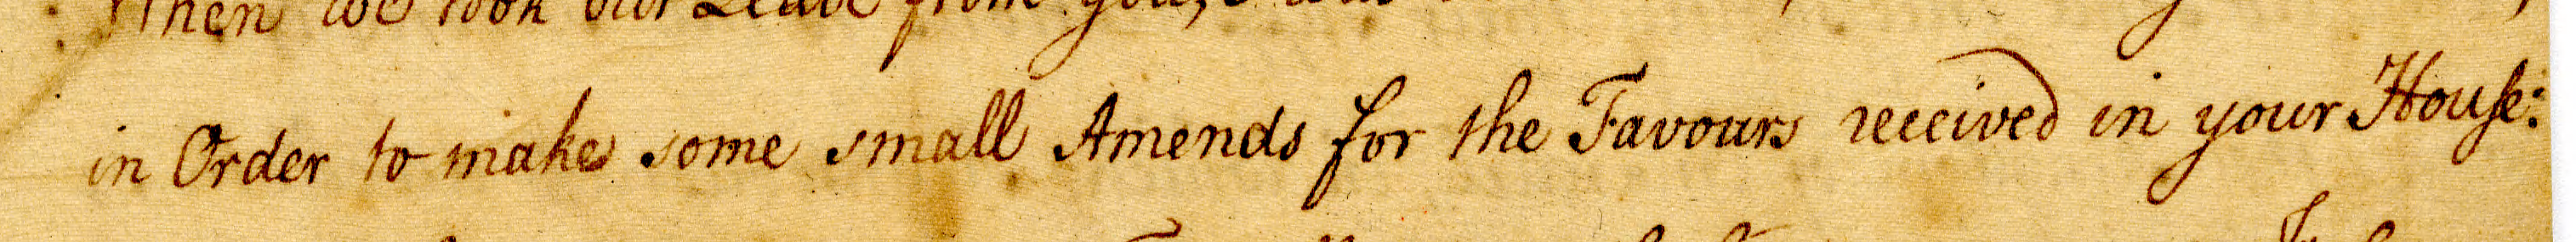in Order to make some small Amends for the Favours received in your House:
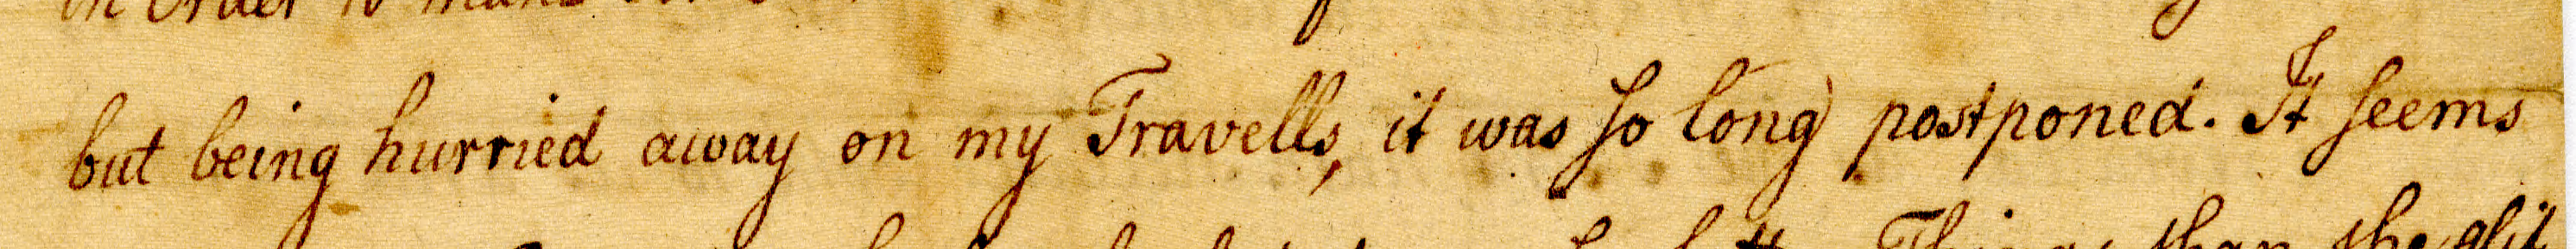but being hurried away on my Travells, it was so long postponed. It seems
